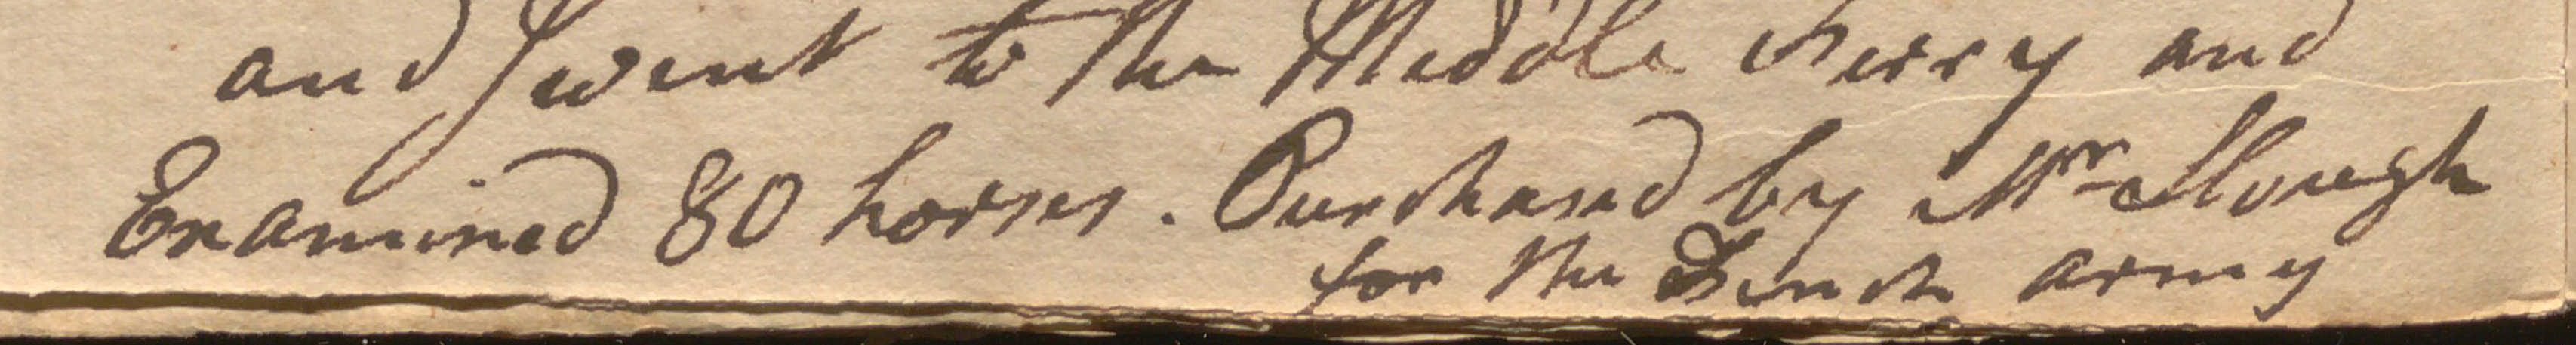Examined 80 horses. Purchased by M^r. Slough
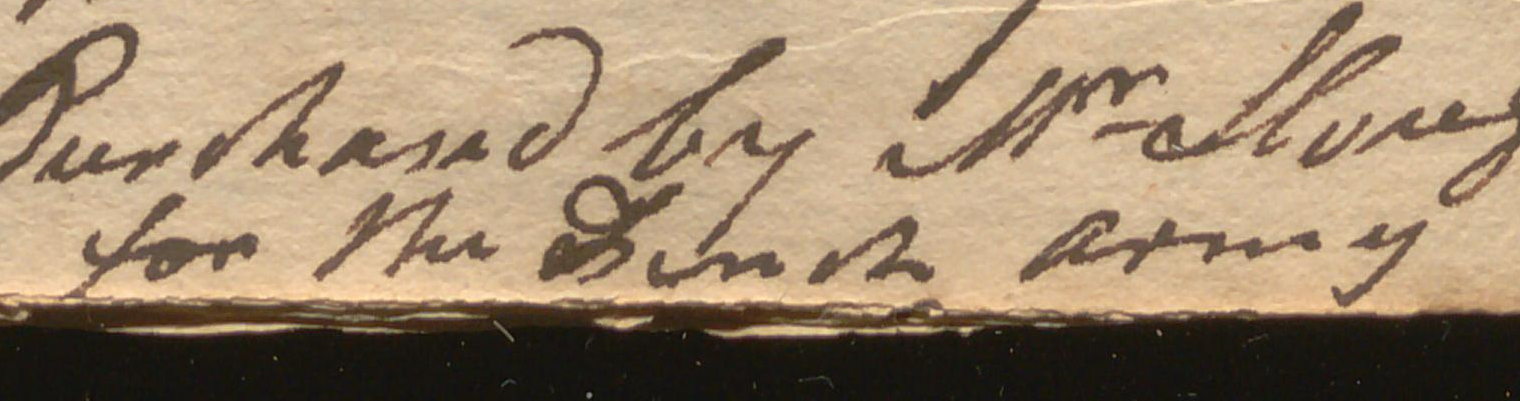for the French army
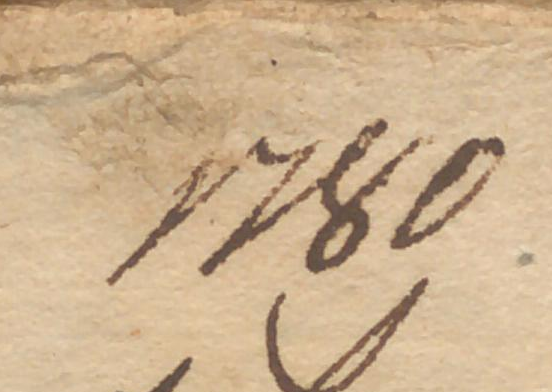1780
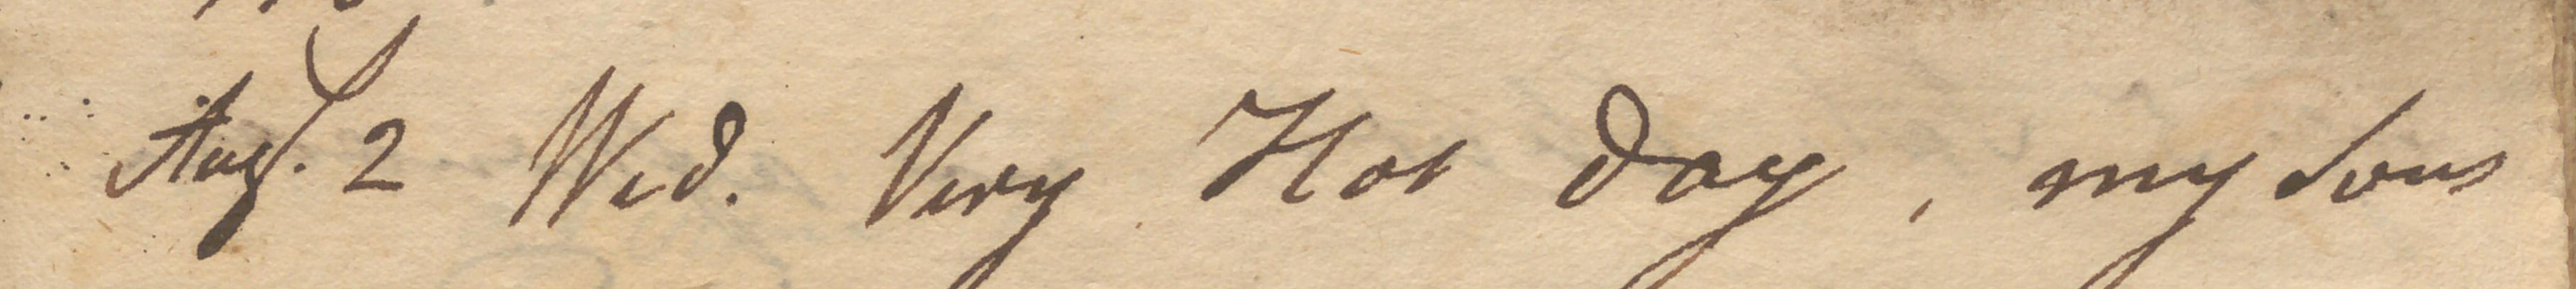Aug^t. 2 Wed. Very Hot day, my sons
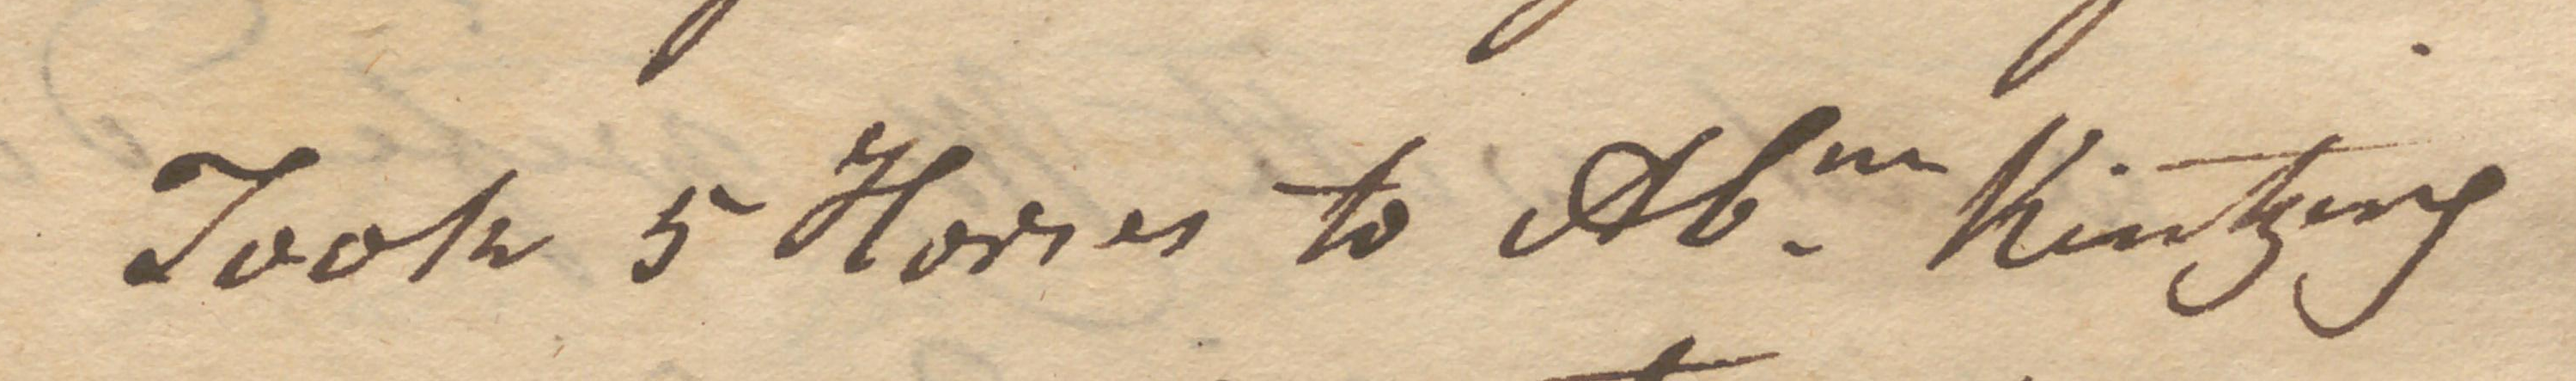Took 5 Horses to Ab^m. Kintzing
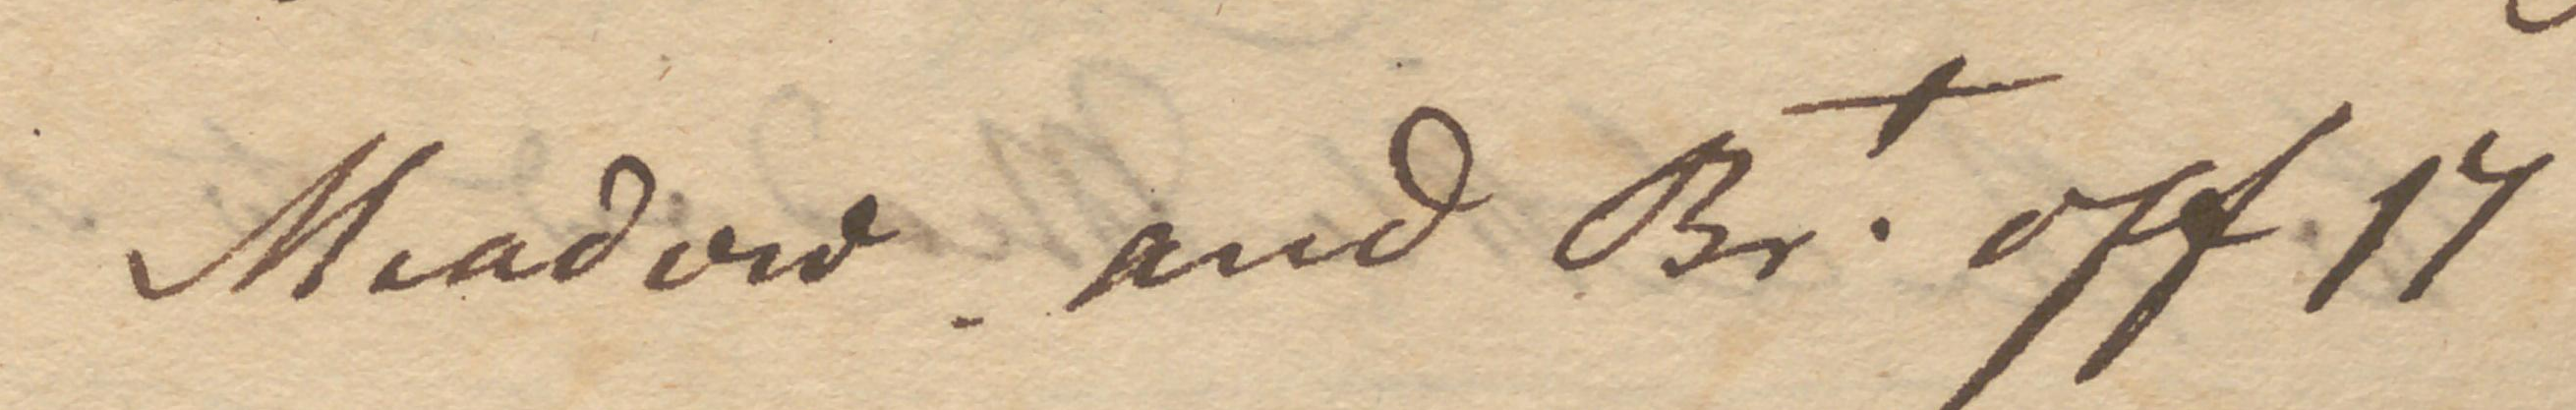Meadow and Br^t. off 17
